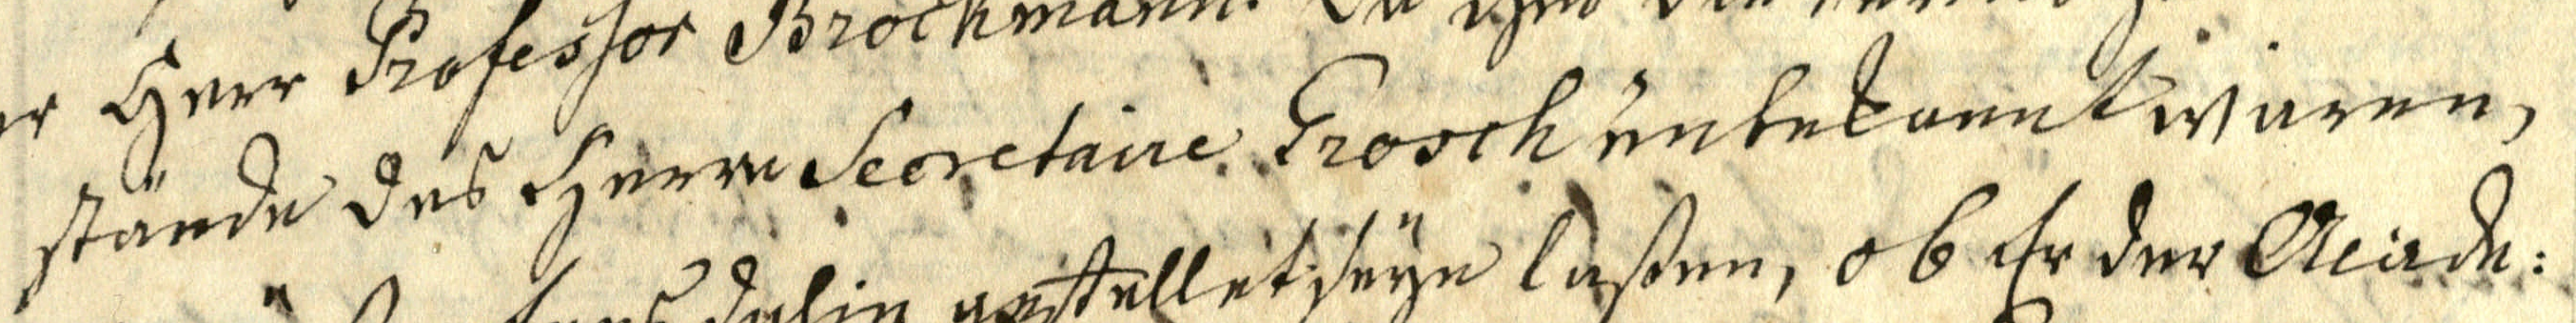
stände des Herrn Secretaire Grosch unbekannt wären,
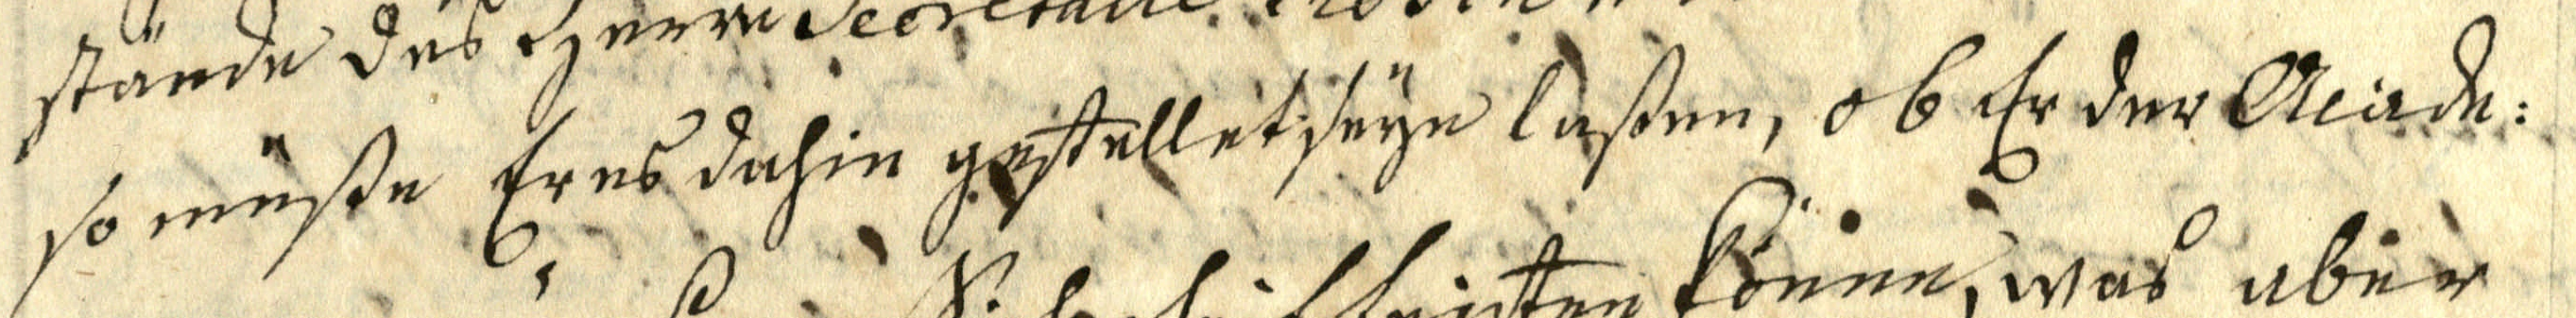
so müße Er es dahin gestellet seÿn laßen, ob Er der Acade¬
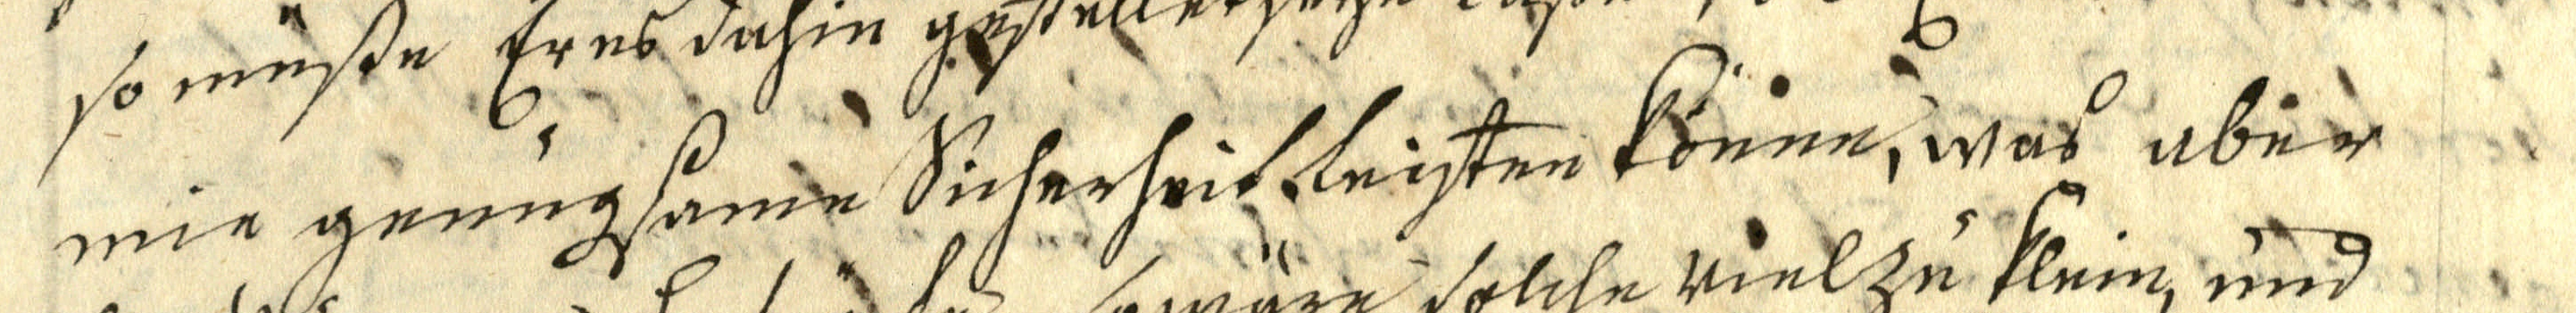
mie gennügsame Sicherheit leisten könne, was aber
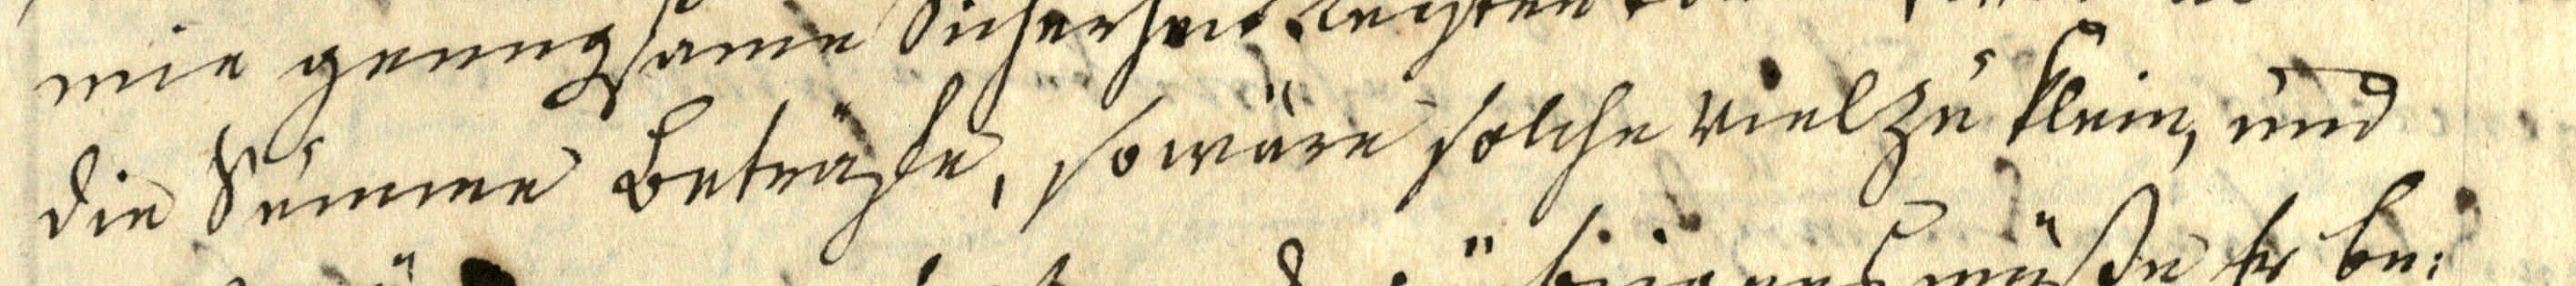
die Summe beträfe, so wäre solche viel zu klein, und
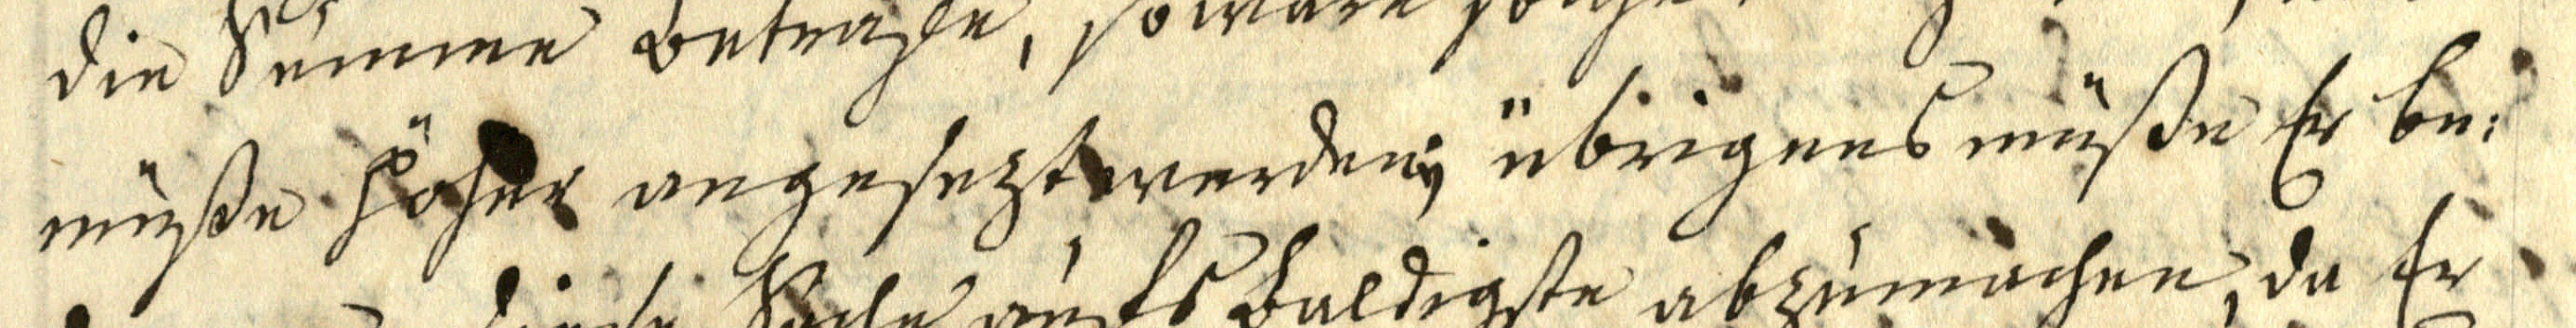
müße höher angesezt werden; übrigens müße Er be¬
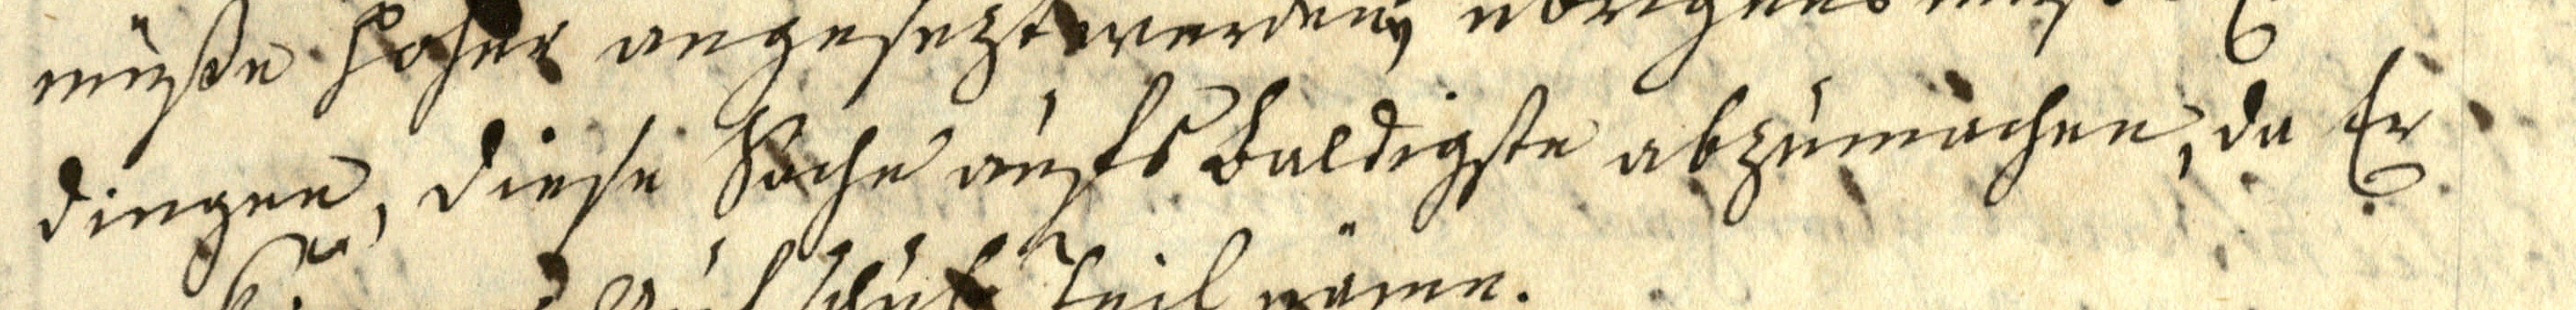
dingen, diese Sache auf baldigste abzumachen, da Er
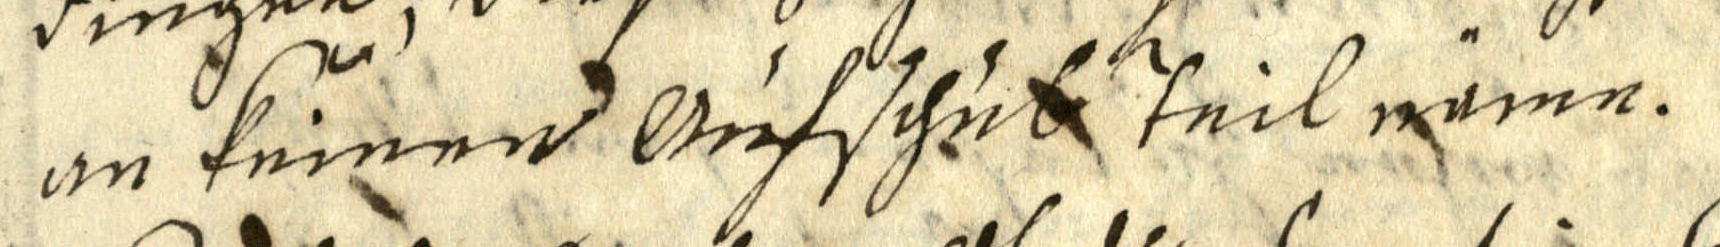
an keinen Aufschub Teil näme.
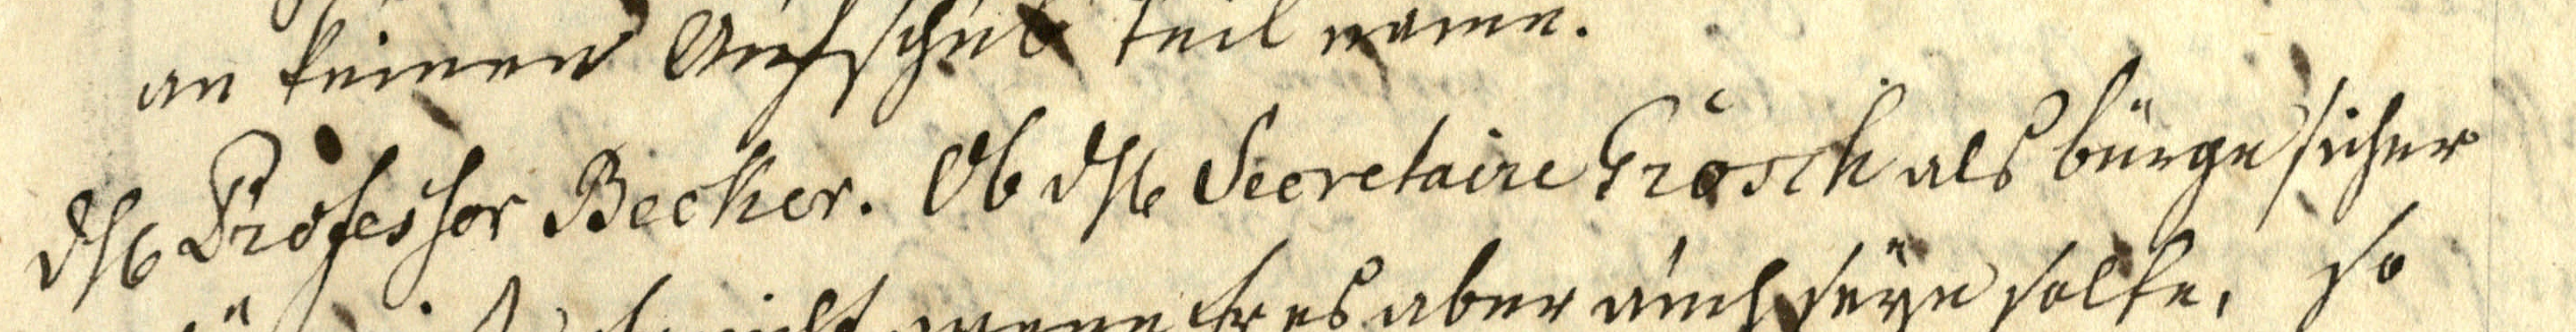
dh. Professor Becker. Ob dh Secretaire Grosch als bürge sicher
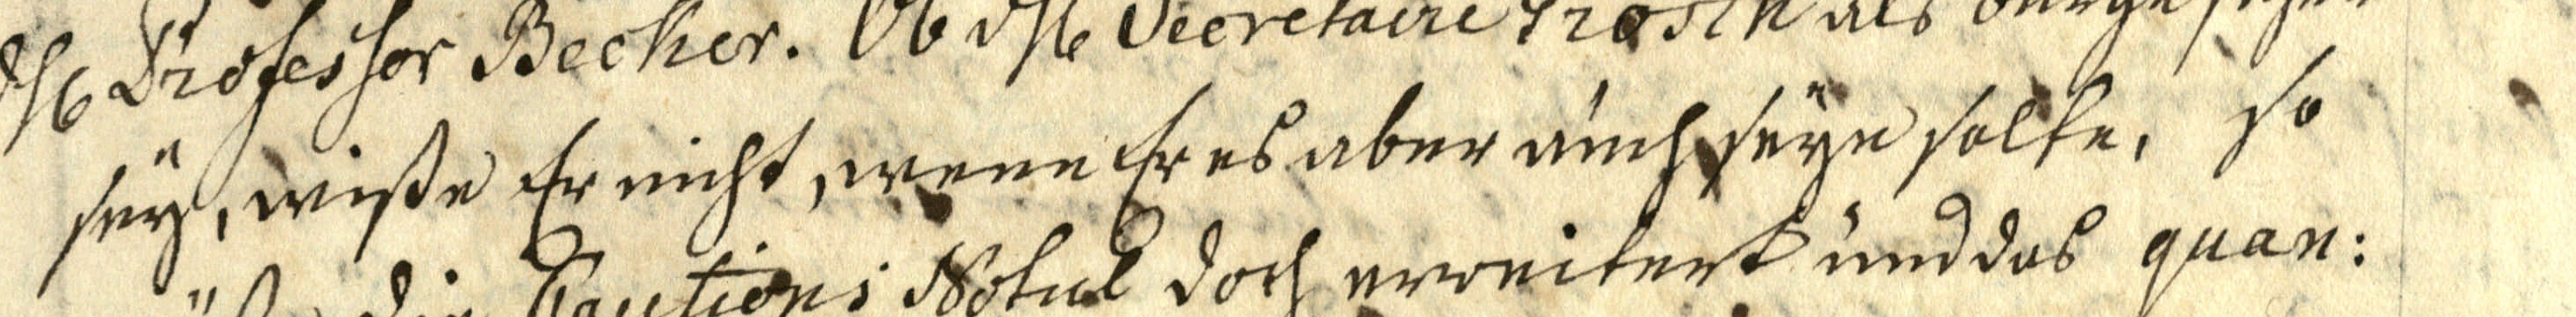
seÿ, wiße Er nicht, wenn Er es aber auch seÿn solte, so
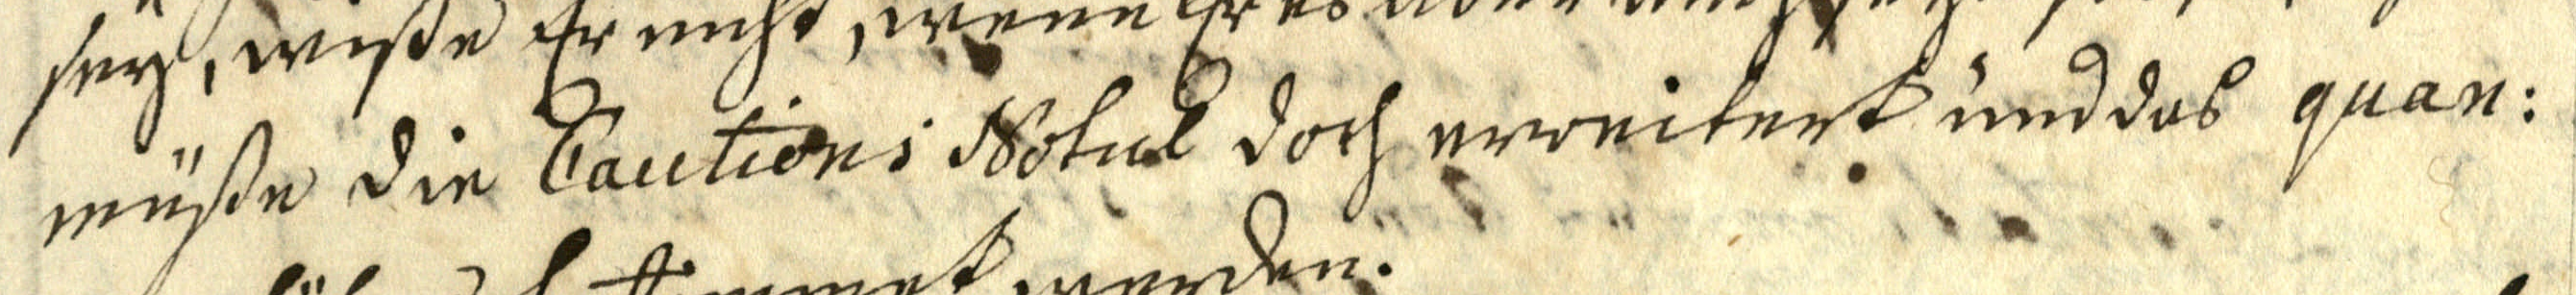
müße die Cautions Notul doch erweitert und das quan¬
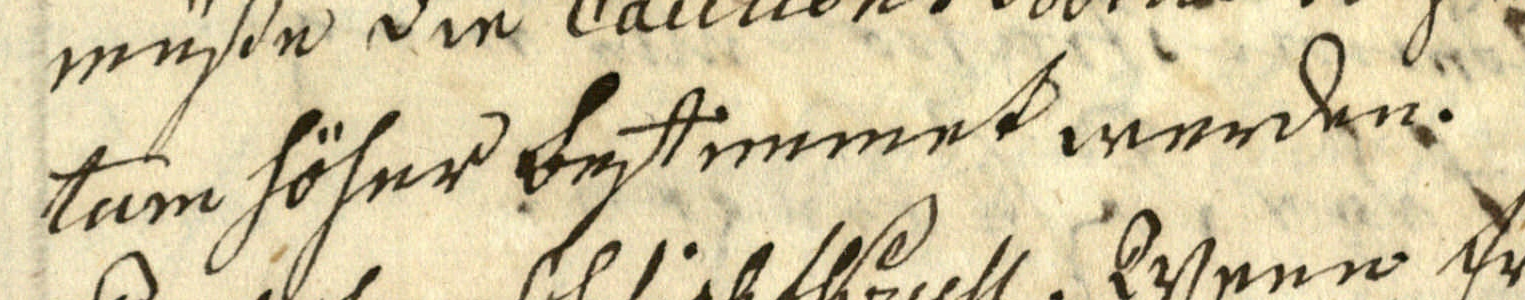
tum höher bestimmet werden.
